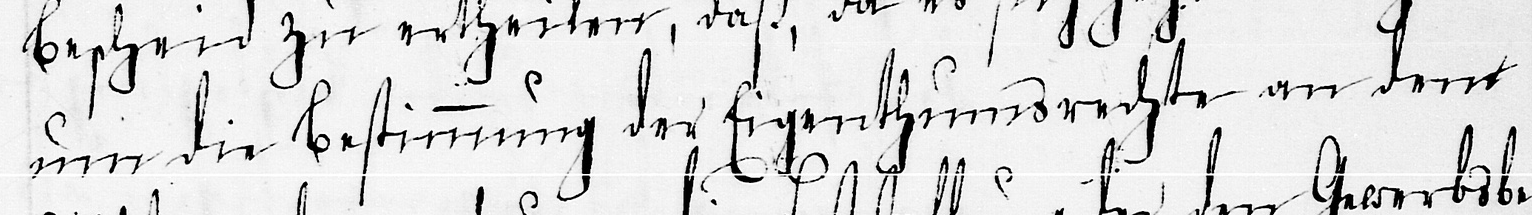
um die Bestimmung der Eigenthumsrechte an dem
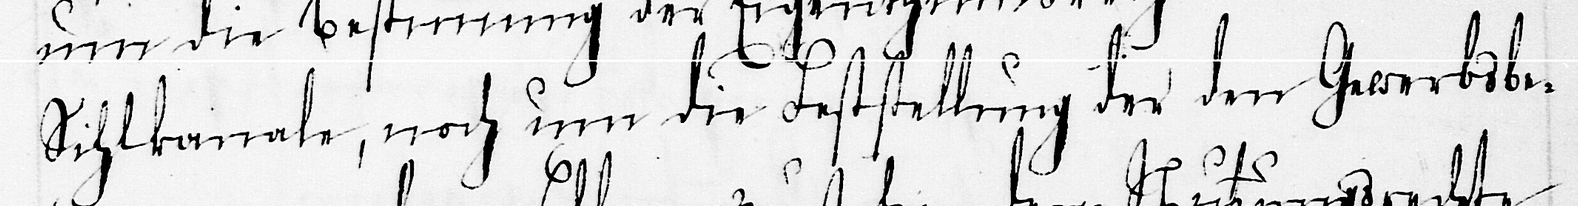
Sihlkanale, noch um die Feststellung der den Gewerbebe¬
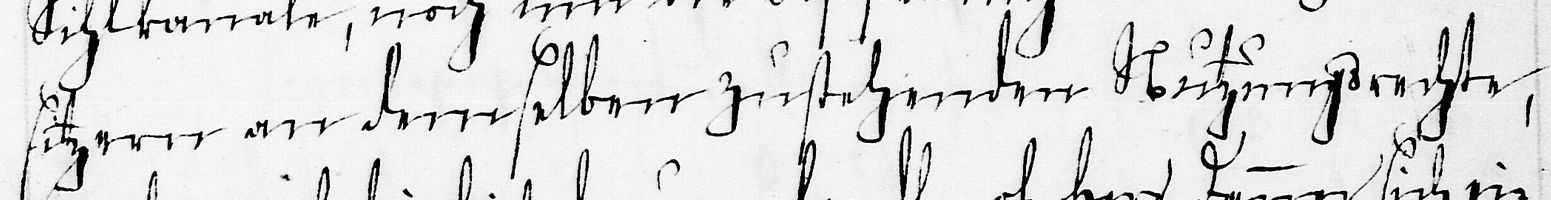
sitzern an demselben zustehenden Nutzungsrechte,
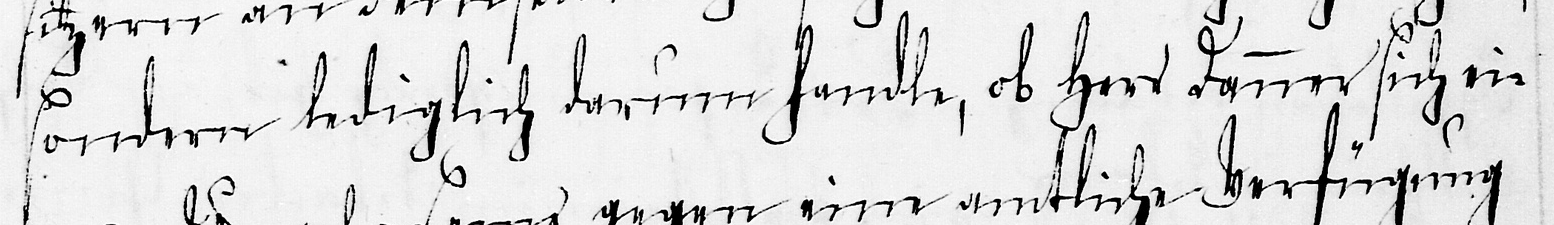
sondern lediglich darum handle, ob Herr Danner sich ei¬
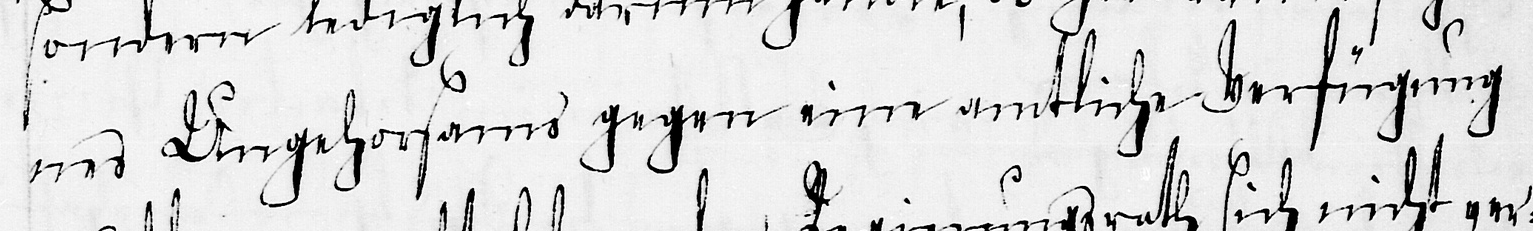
nes Ungehorsams gegen eine amtliche Verfügung
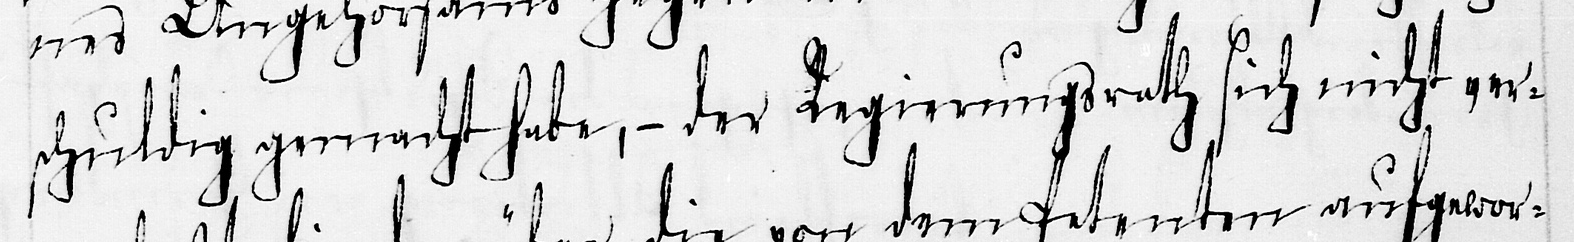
schuldig gemacht habe, – der Regierungsrath sich nicht ver¬
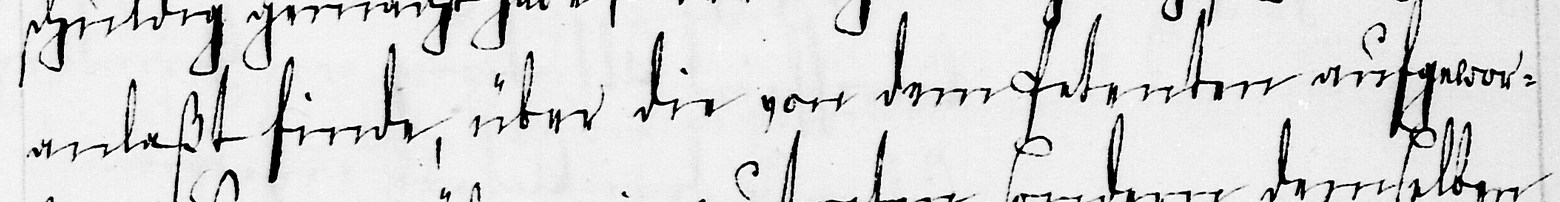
anlaßt finde, über die von dem Petenten aufgewor¬
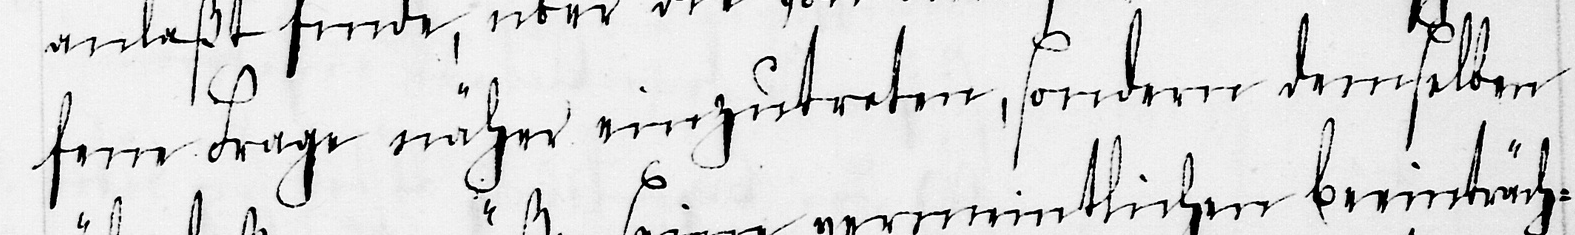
fene Frage näher einzutreten, sondern demselben
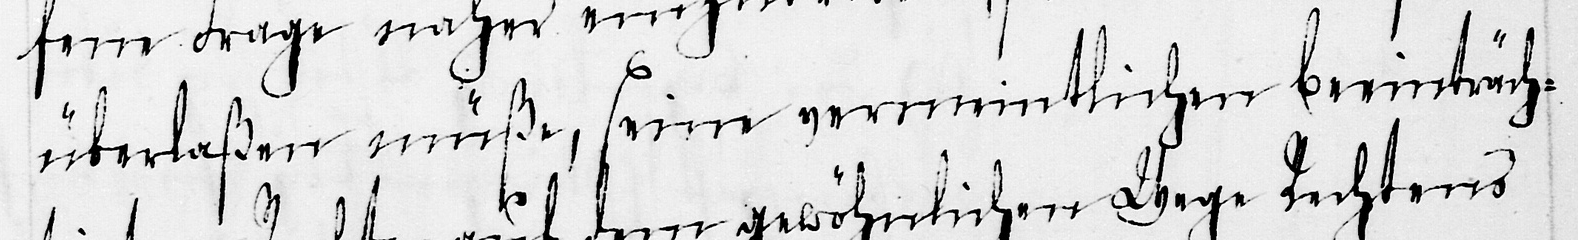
überlaßen müße, seine vermeintlichen beeinträch¬
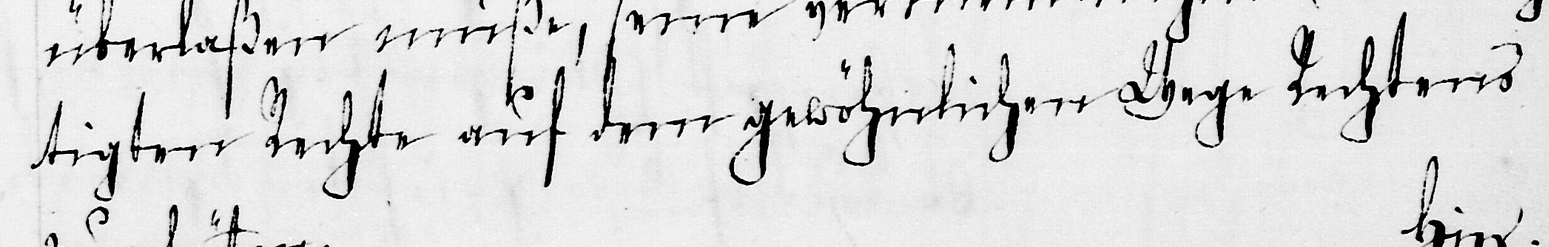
tigten Rechte auf dem gewöhnlichen Wege Rechtens
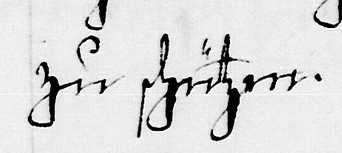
zu schützen.
